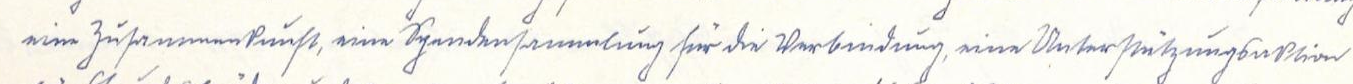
eine Zusammenkunft, eine Spendensammlung für die Verbindung eine Unterstützungsaktion
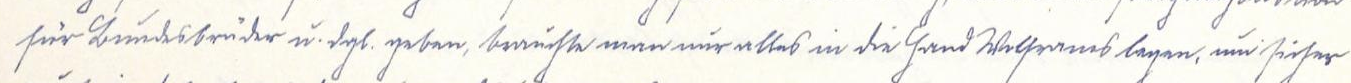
für Bundesbrüder u. dgl. geben, bräuchte man nur alles in die Hand Wolframs legen, um sicher
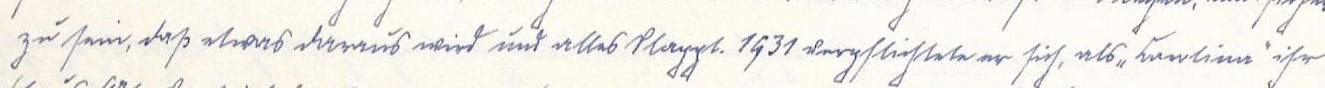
zu sein, daß was daraus wird und alles klappt. 1931 verpflichtete er sich als „Carolina“ ihr
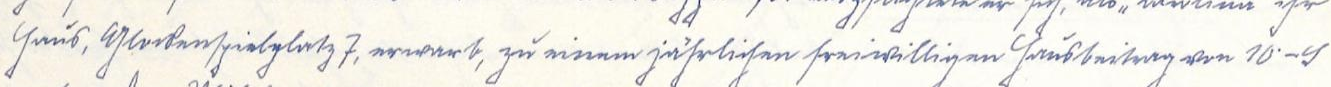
Haus, Glockenspielplatz 7, erwarb, zu einem jährlichen freiwilligen Hausbeitrag von 10 S
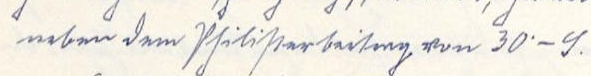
neben dem Philisterbeitrag von 30 S.-
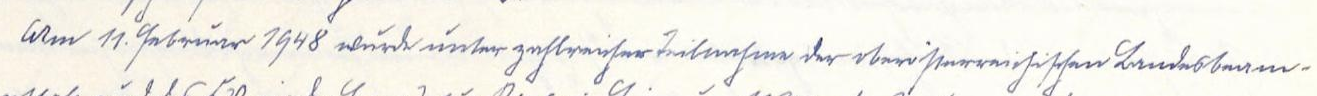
Am 11. Februar 1948 wurde unter zahlreicher Teilnahme der oberösterreichischen Landesbeam-
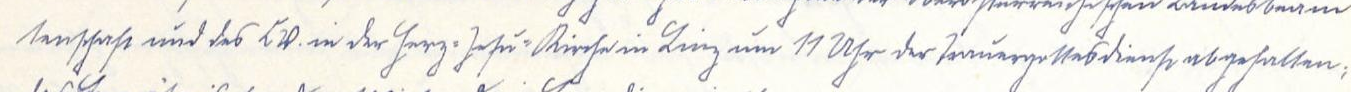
tenschaft und des CV in der Herz-Jesu- Kirche in Linz um 11 Uhr der Trauergottesdienst abgehalten;
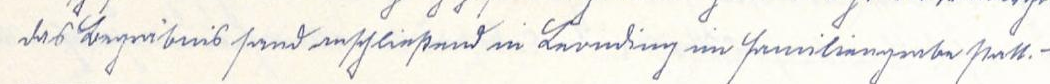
Das Begräbnis fand anschließend in Leonding im Familiengrabe statt.
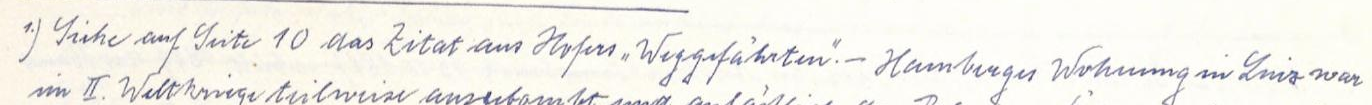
1) Siehe auf Seite 10 das Zitat aus Hofers „Weggefährten“. - Hambergers Wohnung in Linz war
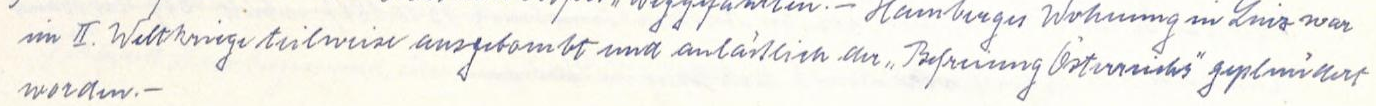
im II. Weltkriege teilweise ausgebombt und anlässlich der „Befreiung Österreichs“ geplündert
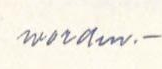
worden.
